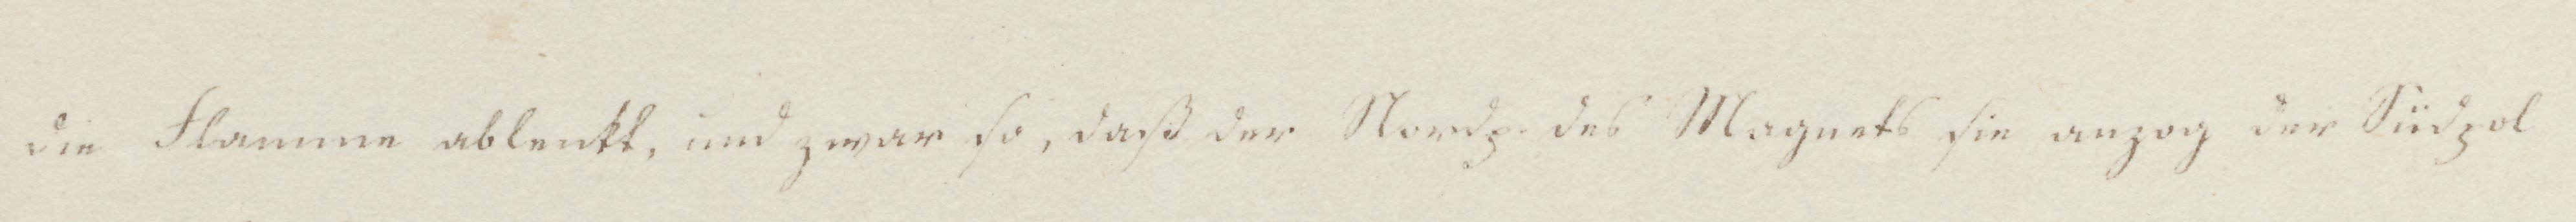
die Flamme , und zwar so, daß der Nordp. des Magnets sie anzog der Südpol
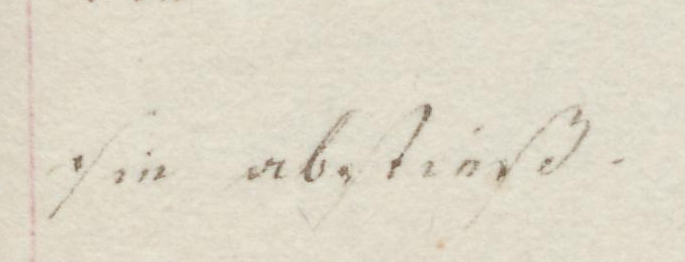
sie abstieß.
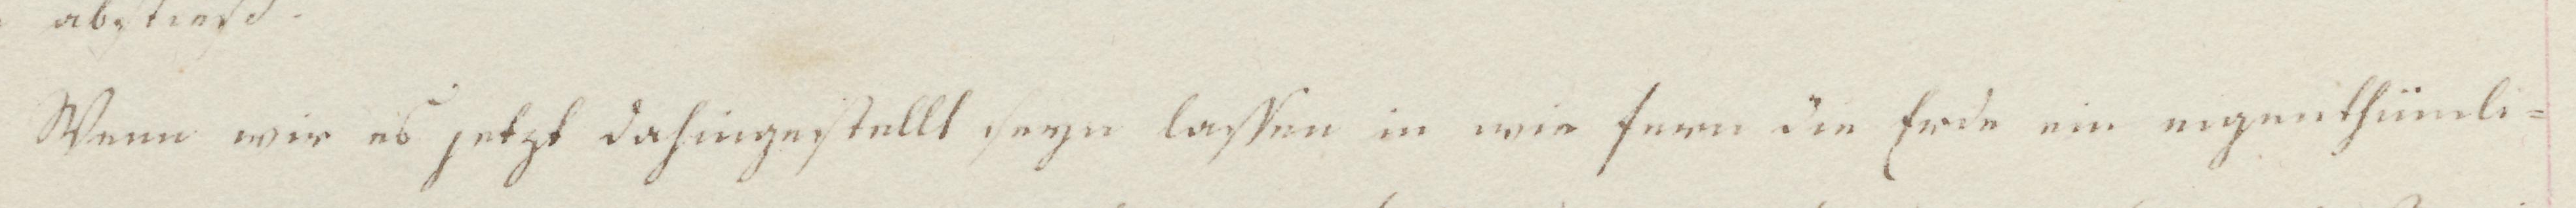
Wenn wir es jetzt dahingestellt seyn lassen in wie fern die Erde ein eigenthümli-
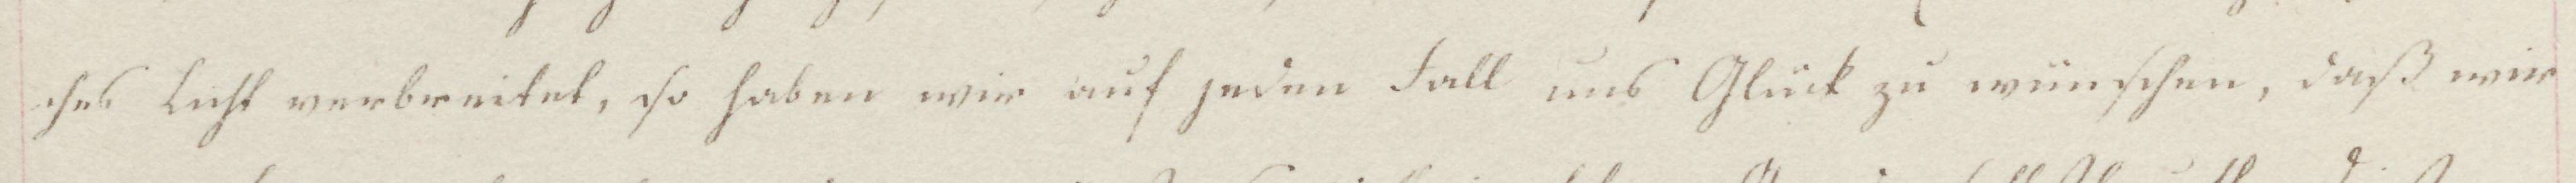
ches Licht verbreitet, so haben wir auf jeden Fall uns Glück zu wünschen, daß wir
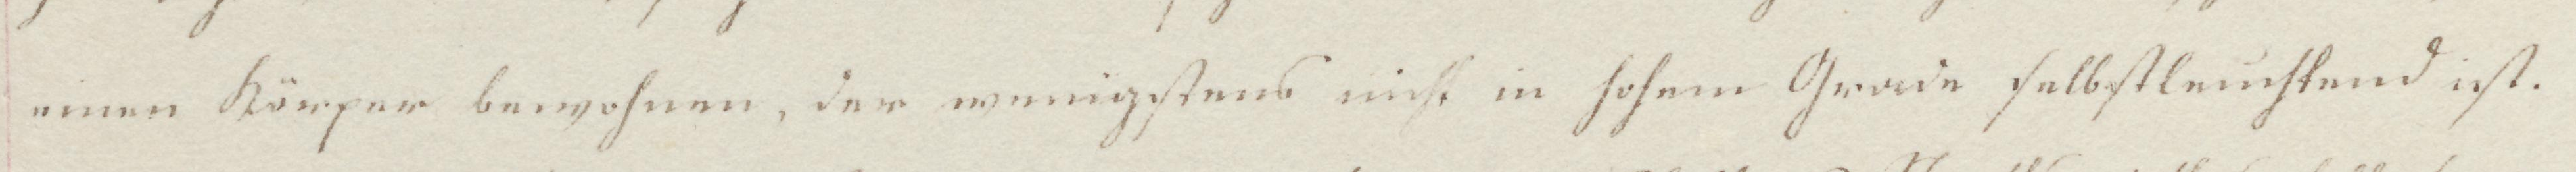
einen Körper bewohnen, der wenigstens nicht in hohem Grade selbstleuchtend ist.
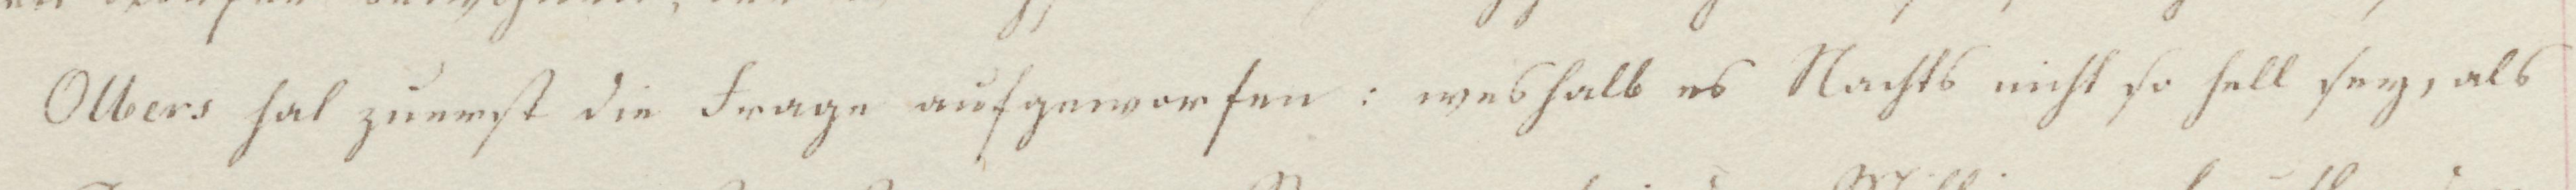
Olbers hat zuerst die Frage aufgeworfen: weshalb es Nachts nicht so hell sey, als
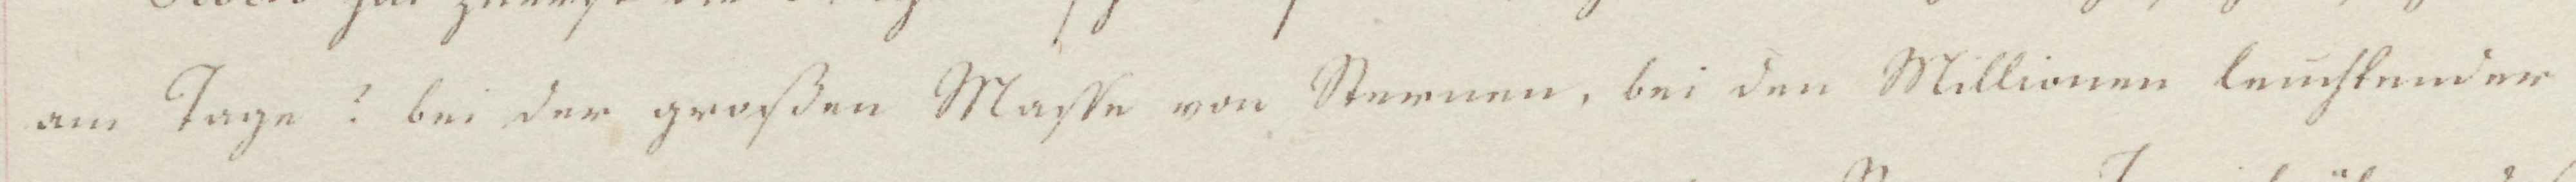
am Tage? bei der großen Masse von Sternen, bei den Millionen leuchtender
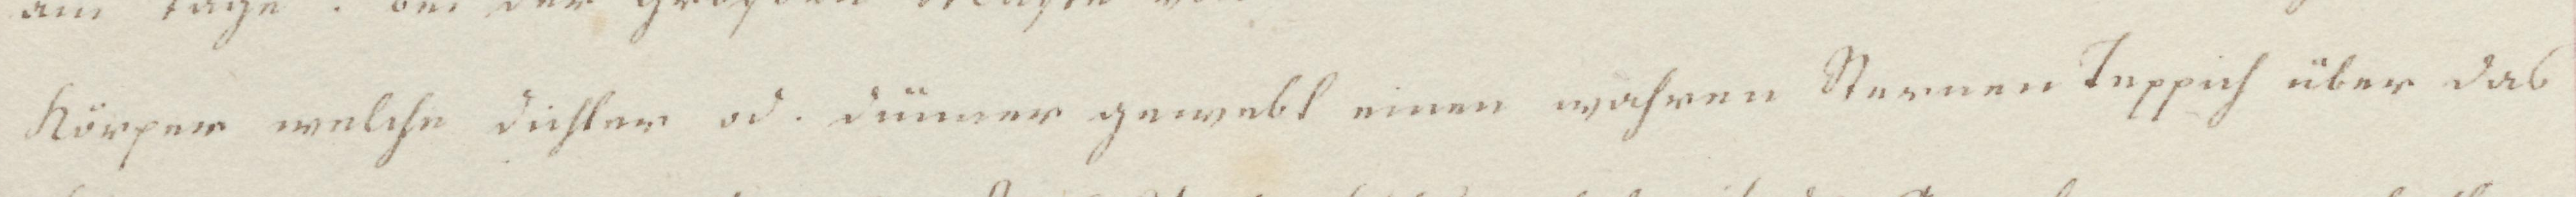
Körper welche dichter od. dünner gewebt einen wahren Sternen Teppich über das
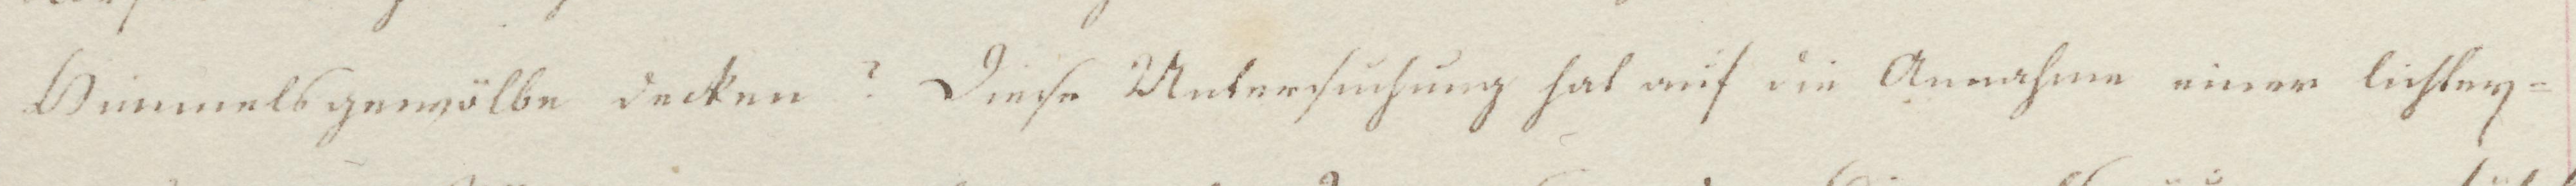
Himmelsgewölbe decken? Diese Untersuchung hat auf die Annahme einer lichtex-
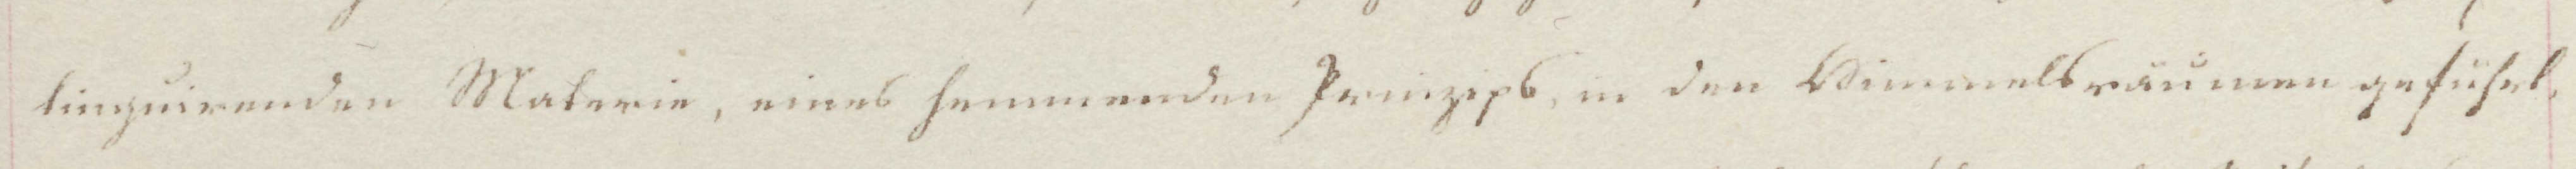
tinguirenden Materie, eines hemmenden Prinzips, in den Himmelsräumen geführt,
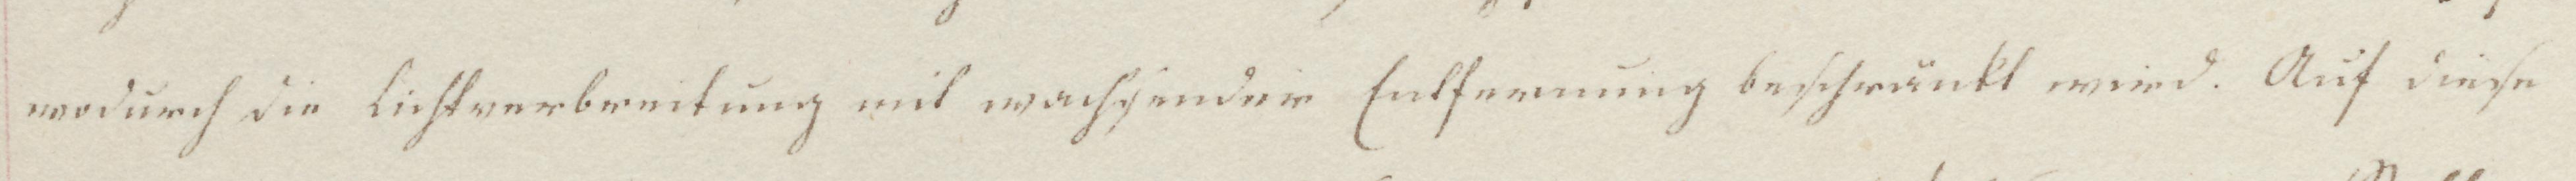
wodurch die Lichtverbreitung mit wachsender Entfernung beschränkt wird. Auf diese
